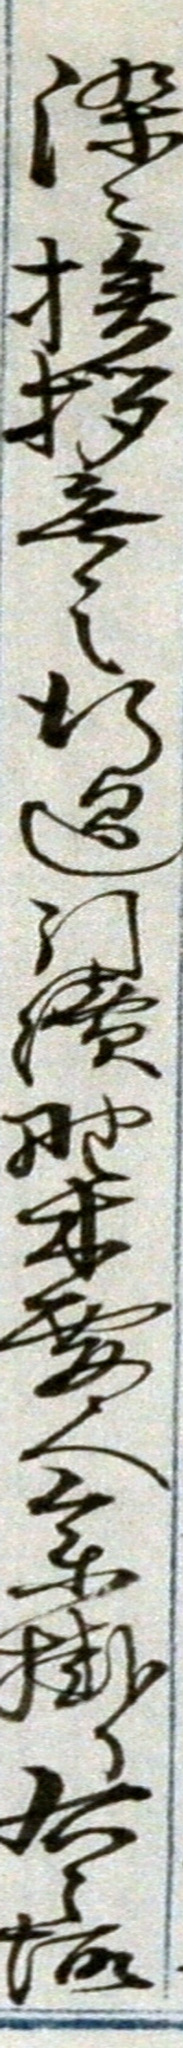染々挨拶無之行過引続野木要人参掛り右之趣
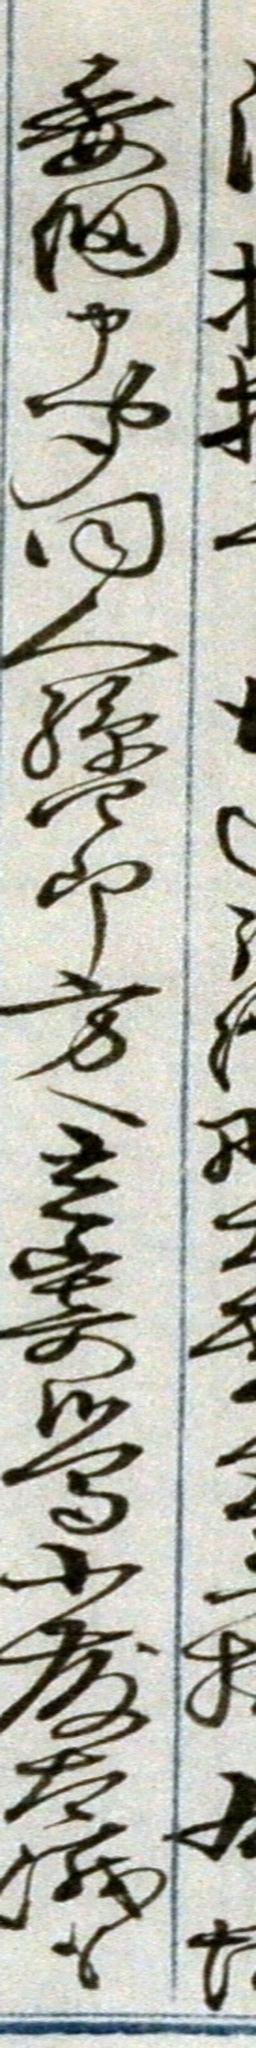委細申聞同人孫四郎方へ立寄候間小藤太儀も
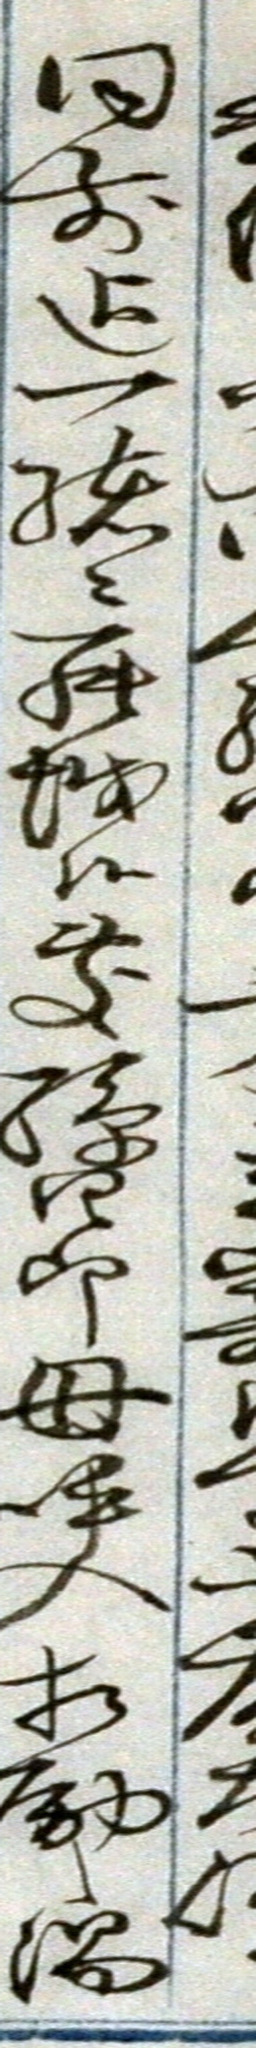同前迄一緒ニ罷越候處孫四郎母呼入相励之湯
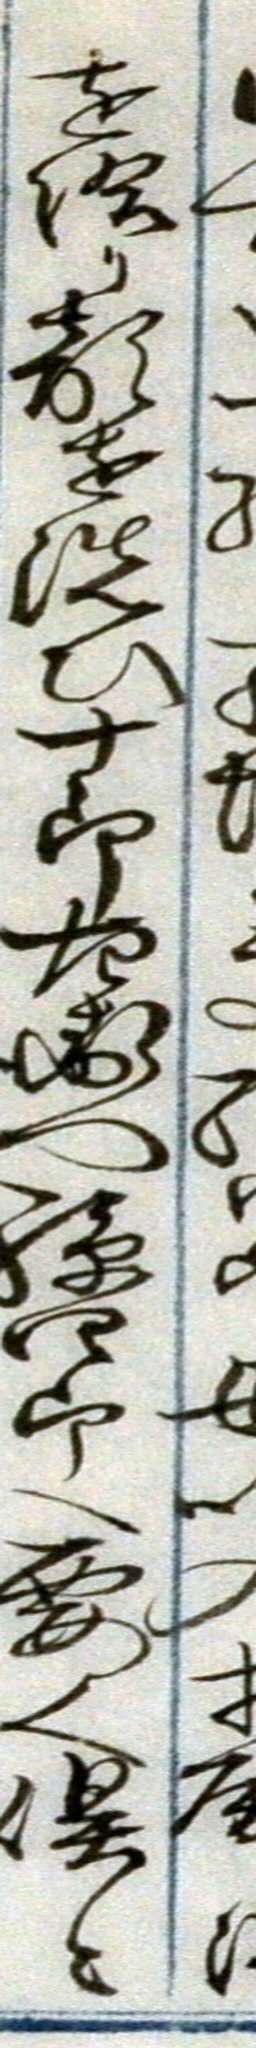を給り顔を洗ひ十郎左衛門孫四郎へ要人倶ニ
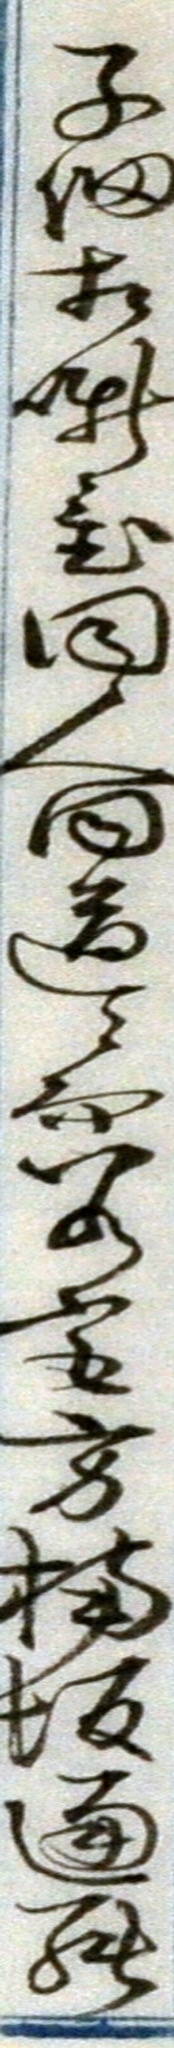子細相噺置同人同道ニ而若宮方楠坂通罷
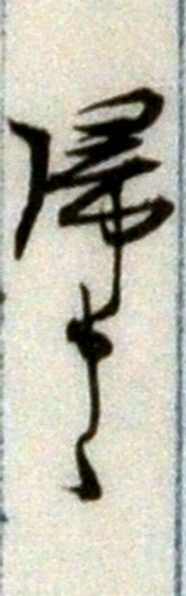帰申候
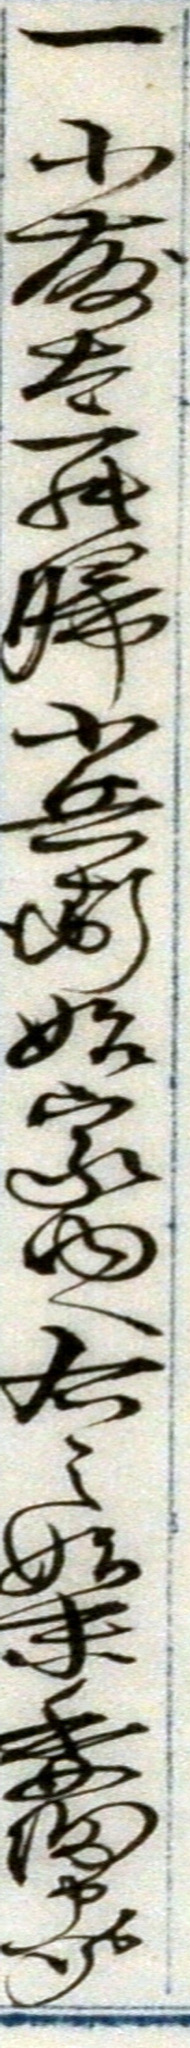一小藤太罷帰小兵衛始家内へ右之始末委細申聞
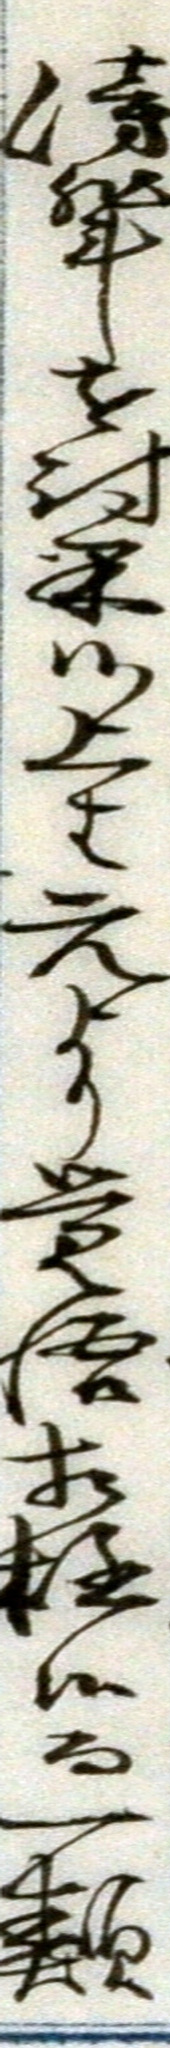傍輩を討果候上者元より覚悟相極候而一類
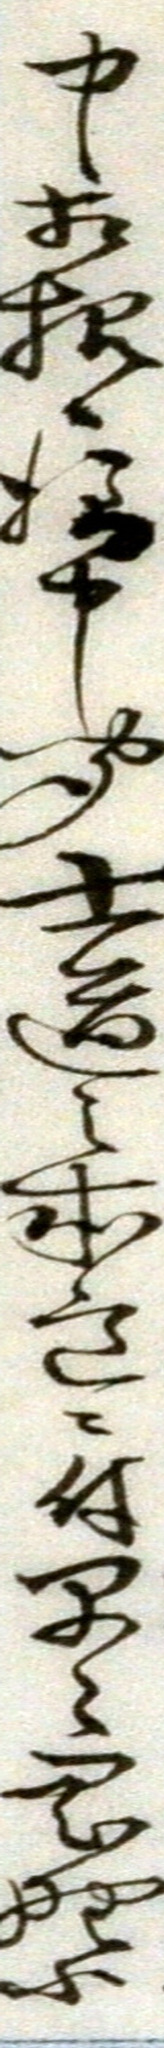中相招候様申聞士道之本意ニ付早々岡野小
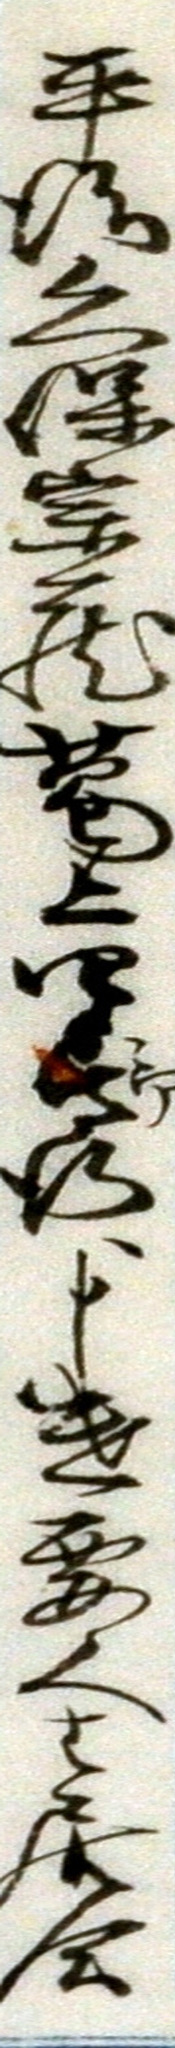平治久保宗蔵葛上四郎治へ申遣要人者居合
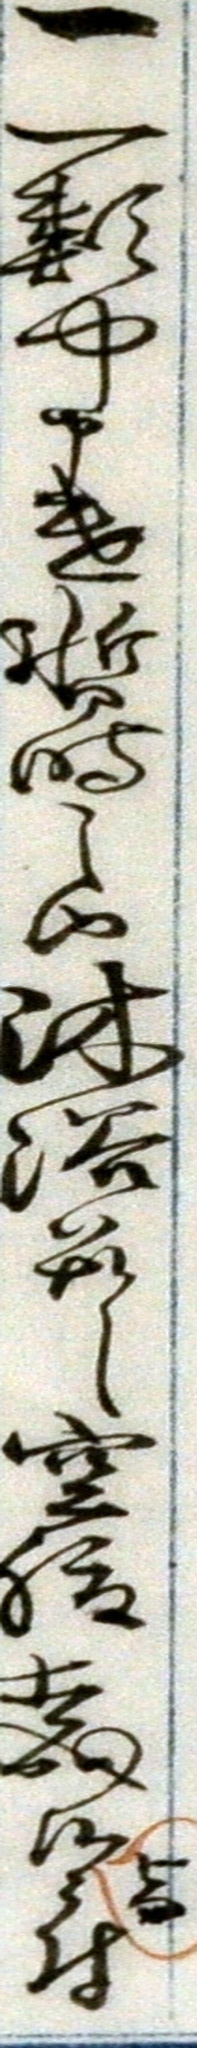一一類中申遣暫時之内沐浴いたし空腹相成候旨ニ付
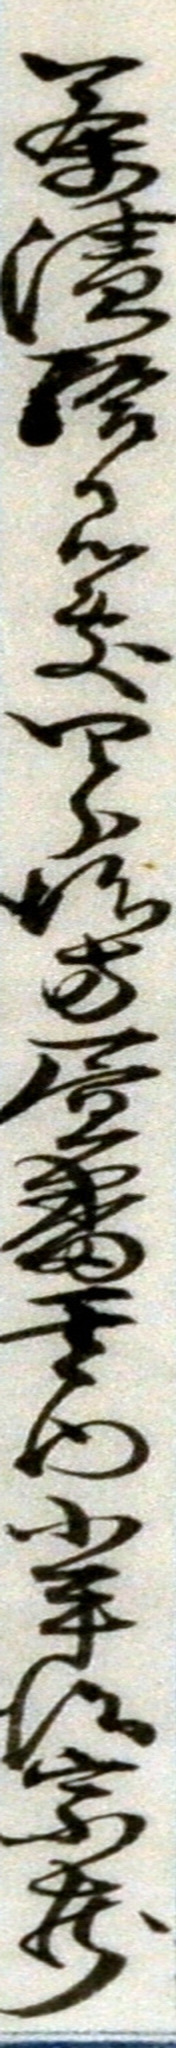茶漬給り候處四郎治方昼番其内小平治宗蔵
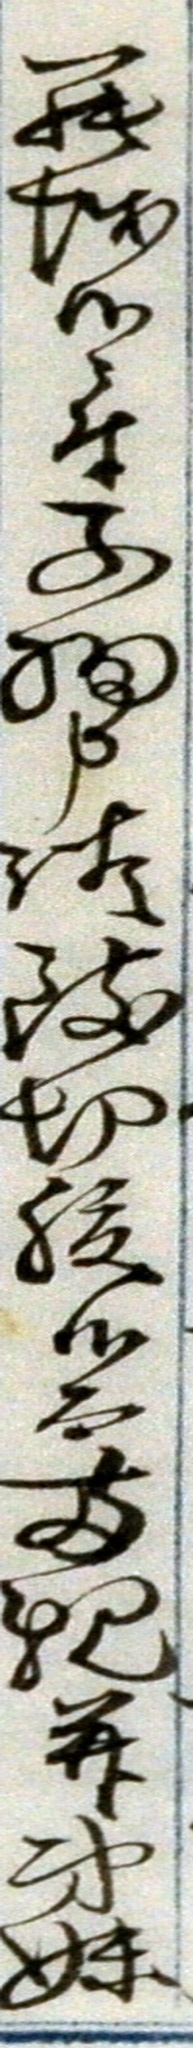罷越候ニ付子細申談致切腹候而両親幷弟妹
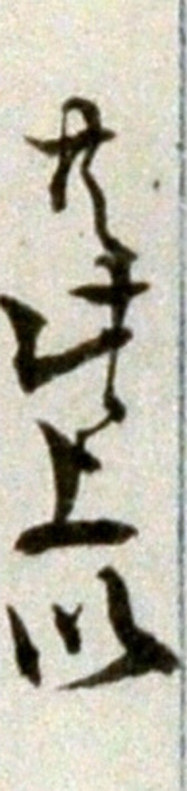共此上以
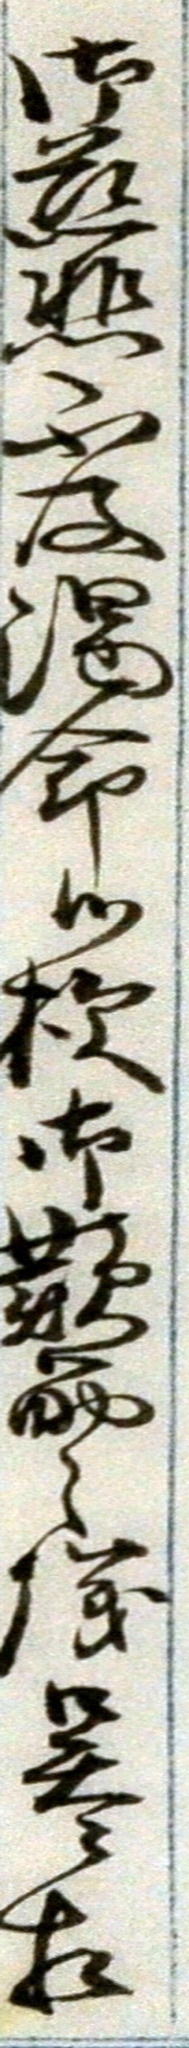御慈悲不及渇命候様御歎筋之儀呉々相
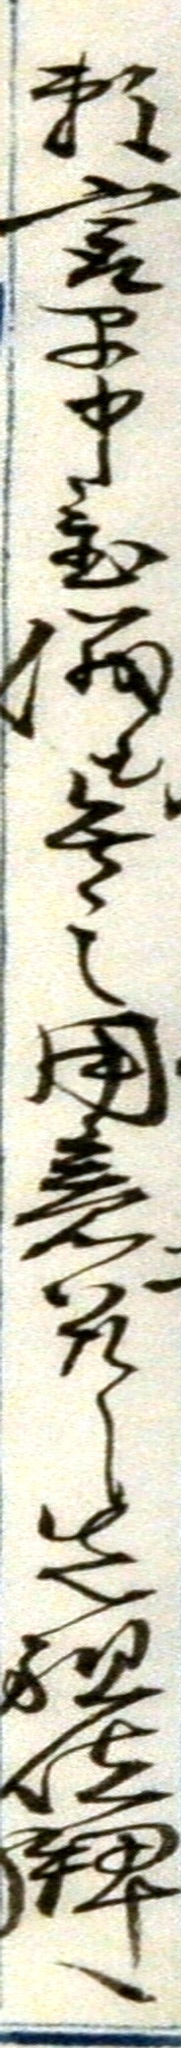頼最早申置儀も無之用意いたし先祖位牌へ
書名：川面小藤太子細有之多賀谷唯右衛門ヲ打果候一件
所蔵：伊那市立高遠町図書館・合同会社AMANE
